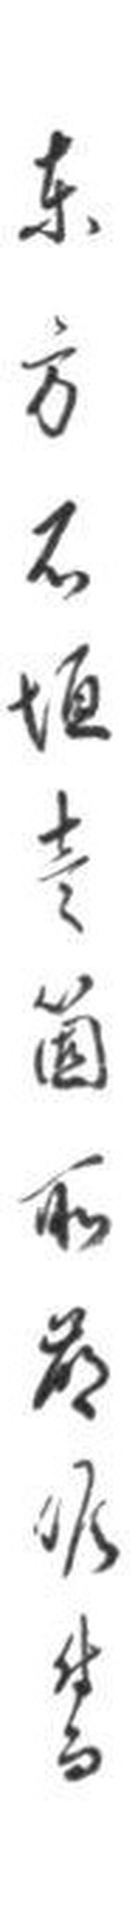東方石垣壱箇所崩候付而
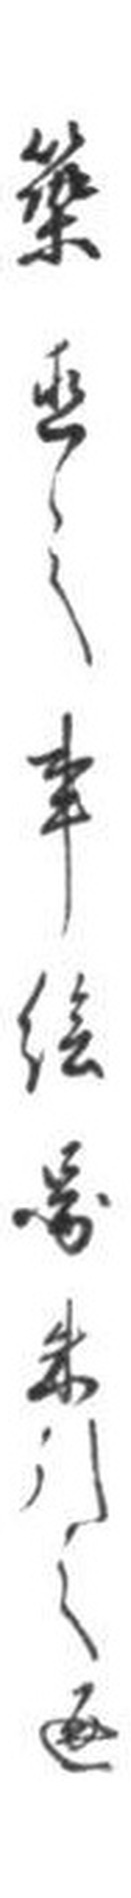築直之事絵図朱引之通
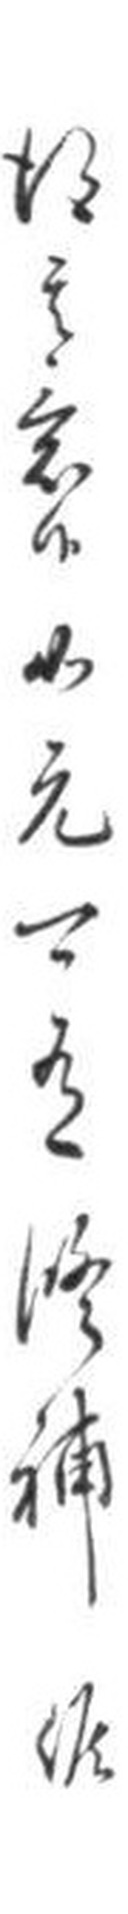得其意候如元可有修補候
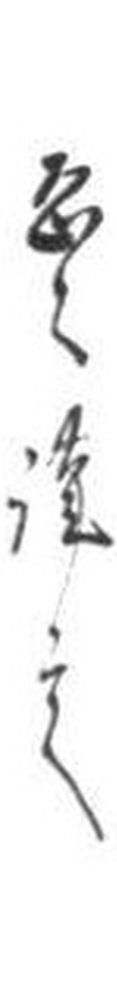恐々謹言
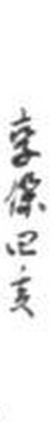享保四亥
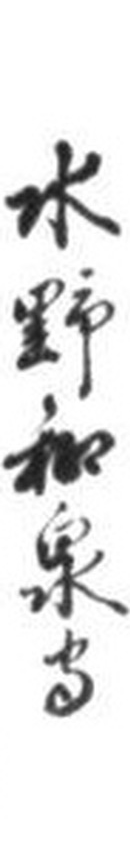水野和泉守
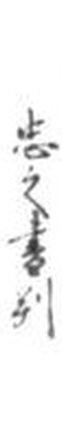忠之書判
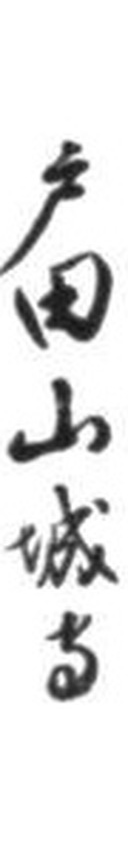戸田山城守
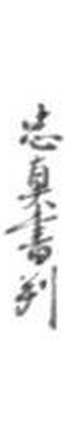忠之書判
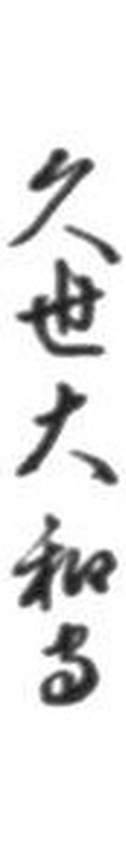久世大和守
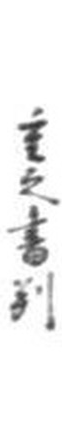重之書判
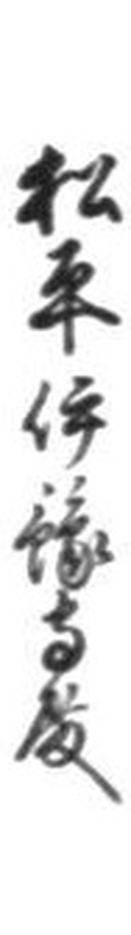松平伊予守殿
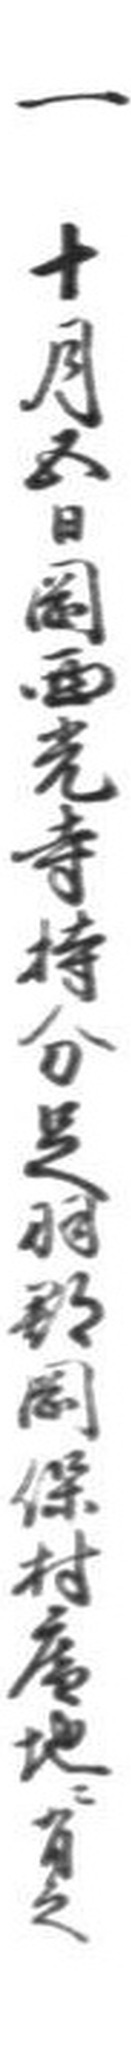一十月五日岡西光寺持分足羽郡岡保村庵地ニ有之
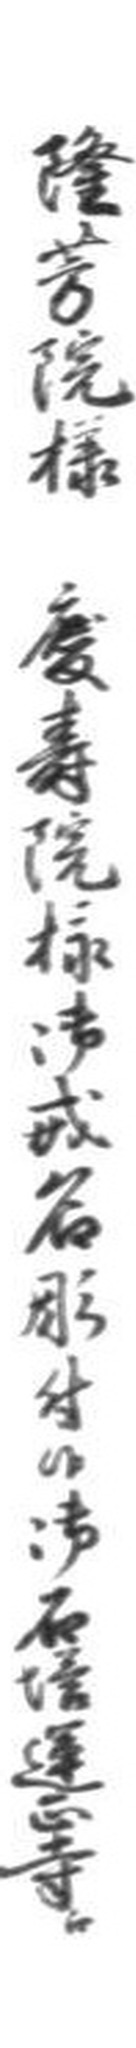隆芳院様慶寿院様御戒名彫付候御石塔運正寺江
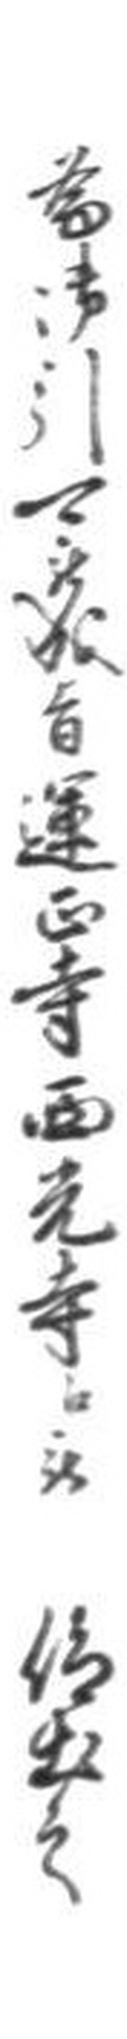為御引可被成旨運正寺西光寺江被仰出之
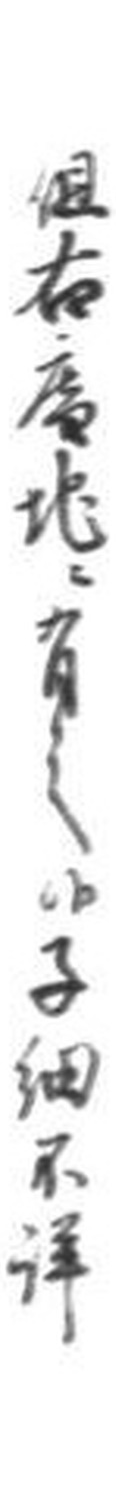但右庵地ニ有之候子細不詳
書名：家譜 三十三 吉邦公 享保四年
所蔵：福井県文書館 Fukui Prefectural Archives
